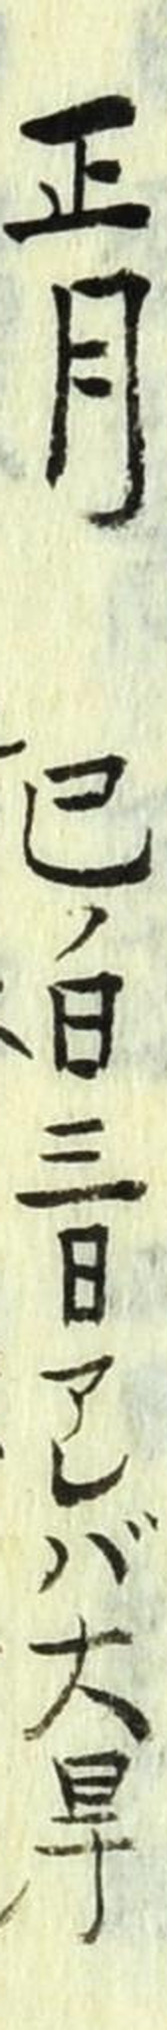正月巳ノ日三日アレバ大旱
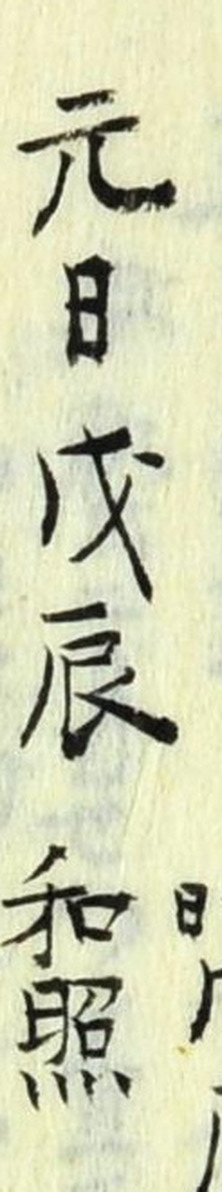元日戊辰和照
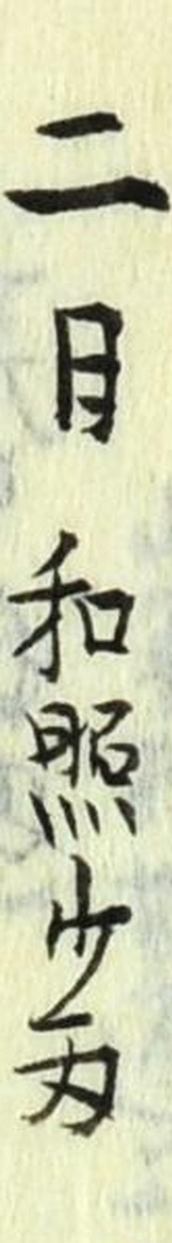二日和照少雨
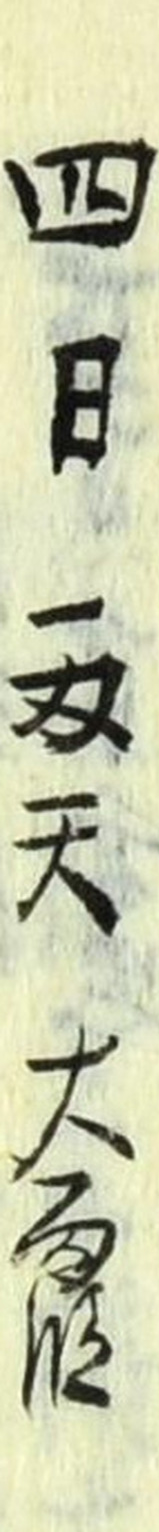四日雨天大霞
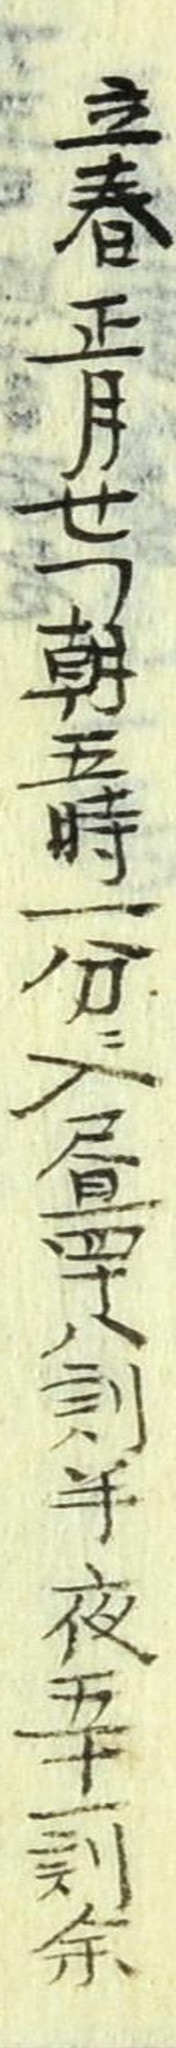立春正月せつ朝五時一分ニ入昼四十八刻半夜五十一刻余
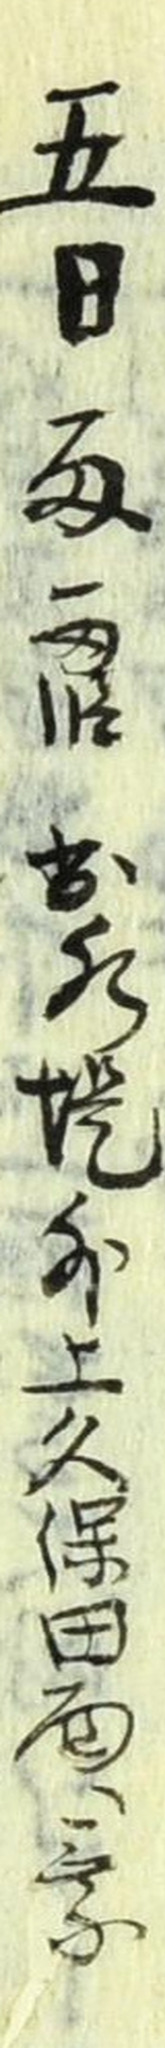五日雨霞出水堤外上久保田面へ乗
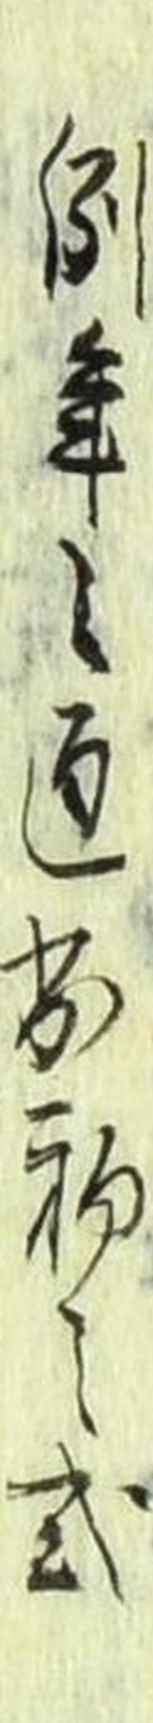例年之通出初之式
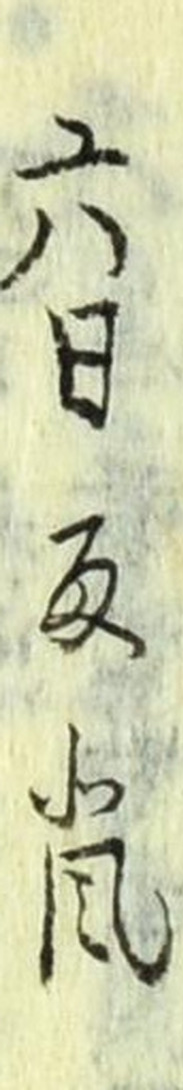六日雨北風
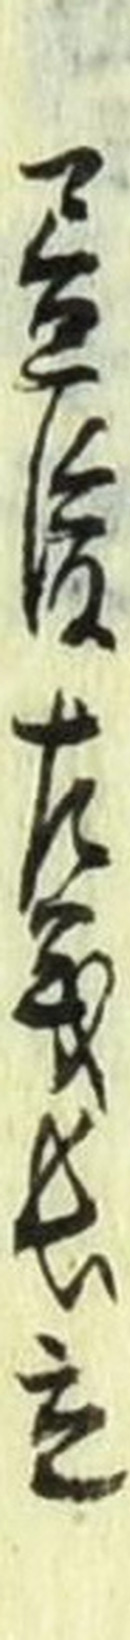昼後左義長立
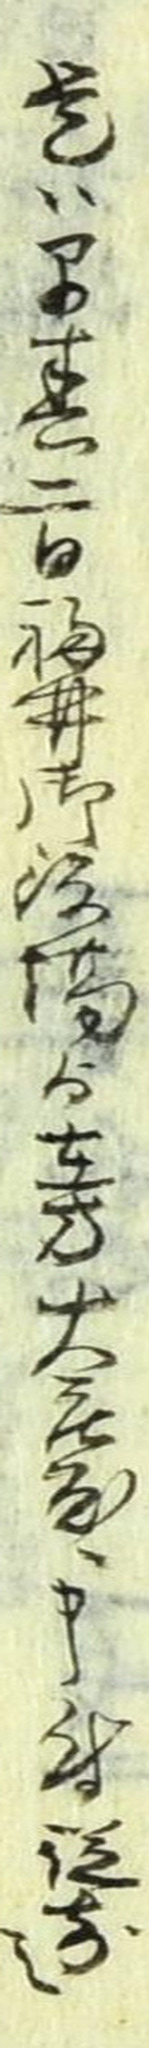是ハ早春二日福井御役場ゟ在方大庄屋へ申付従前之
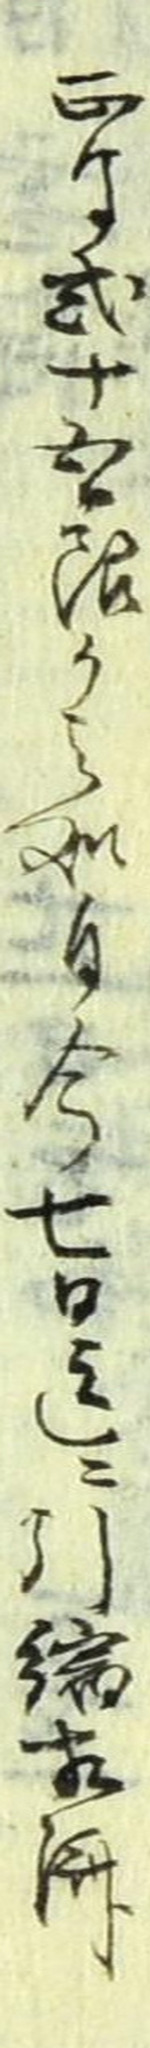正月式十五日限り之処自今七日迄ニ引縮相済
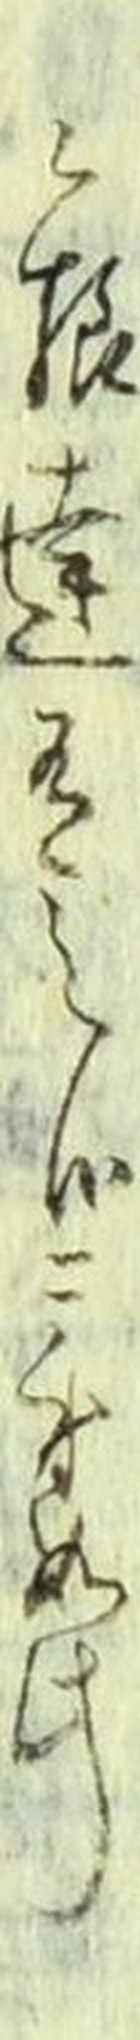候様達有之候ニ付如此
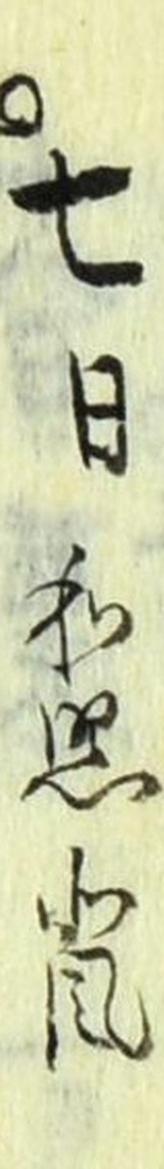○七日和照北風
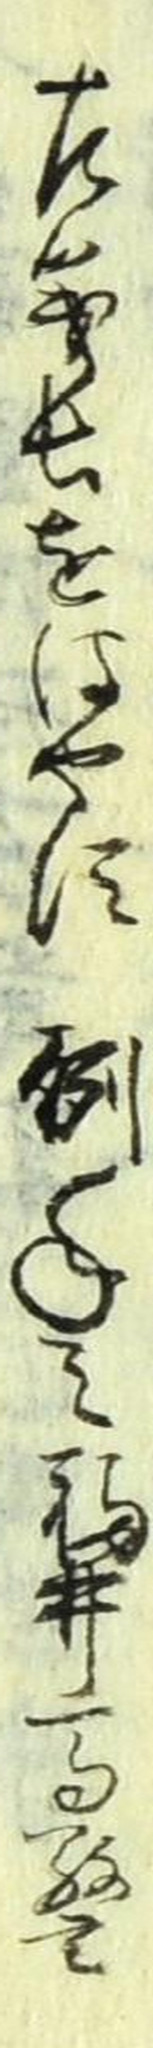左義長をはやす例年之福井馬驚
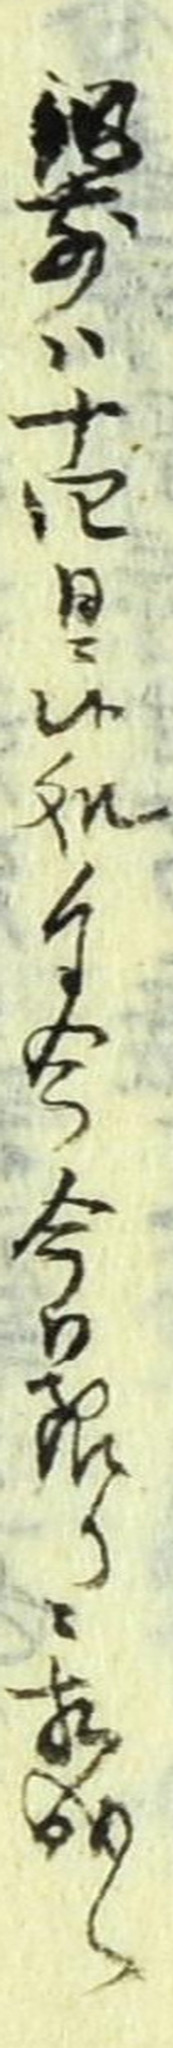以前ハ十四日ニ候処自今今日限りニ相成候
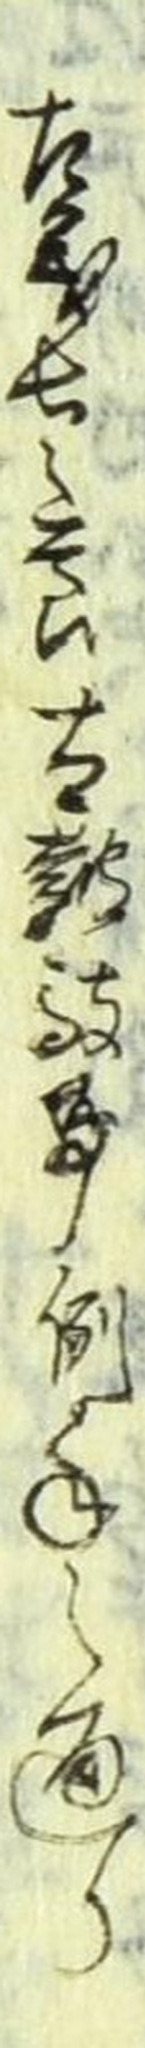左義長之節太鼓敲事例年之通り
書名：（日記）
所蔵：福井県文書館 Fukui Prefectural Archives
